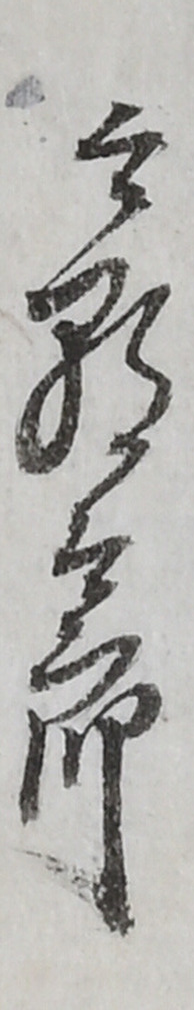今朝太郎
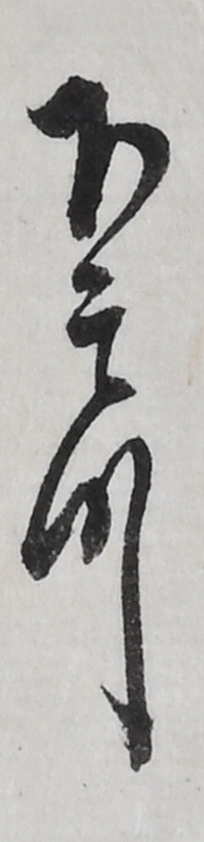下里町
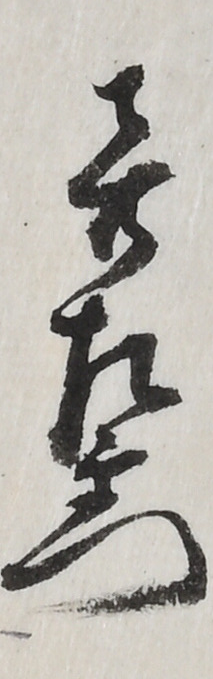喜左衛門

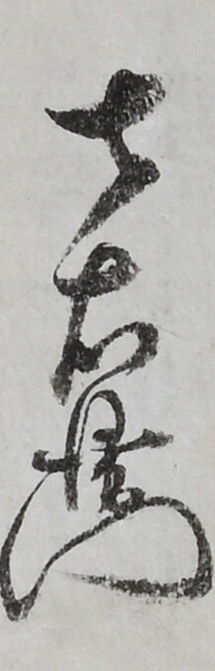七右衛門

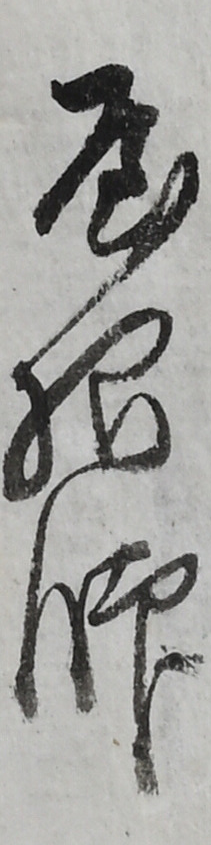屋根師
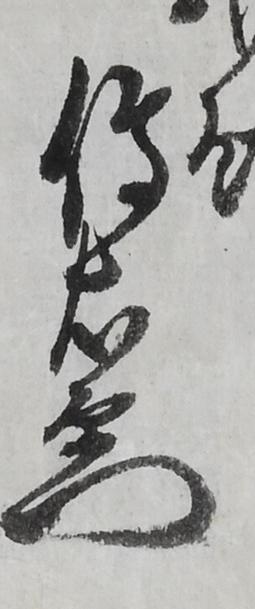伝右衛門
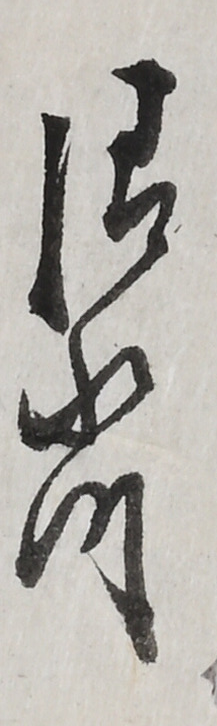清水町

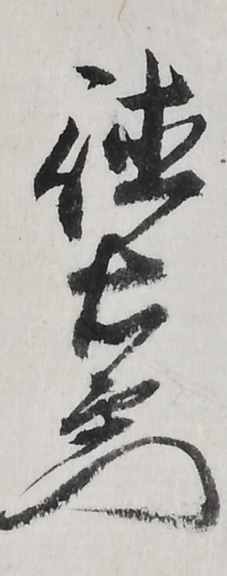徳右衛門

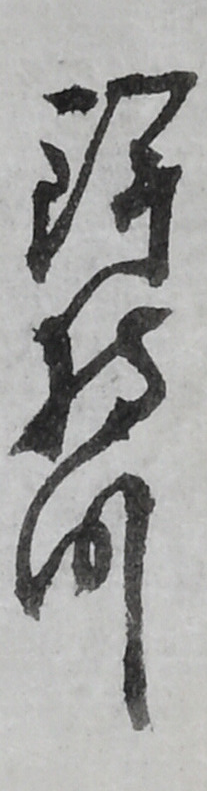鉾持町

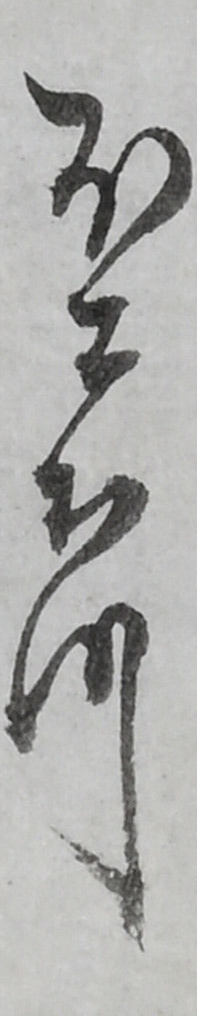ほこち町
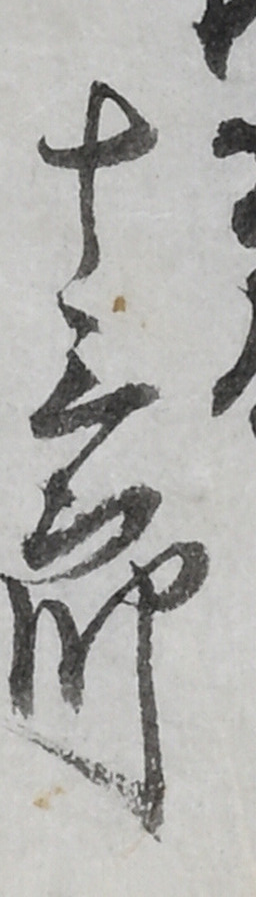十三郎
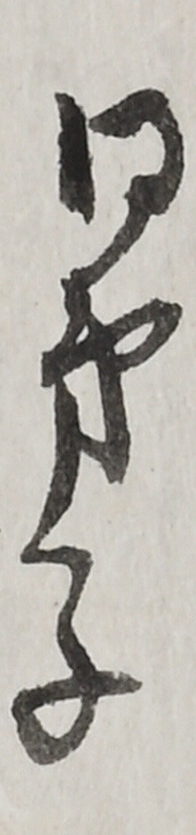同弟子
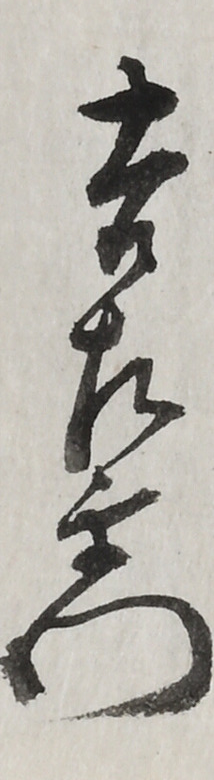吉左衛門

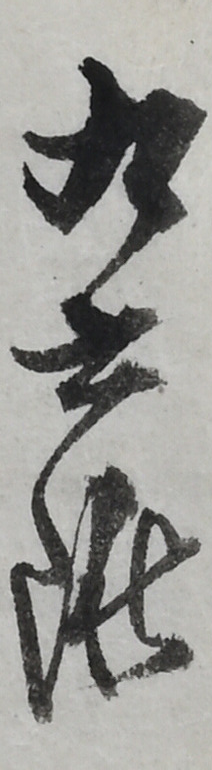九六鍬
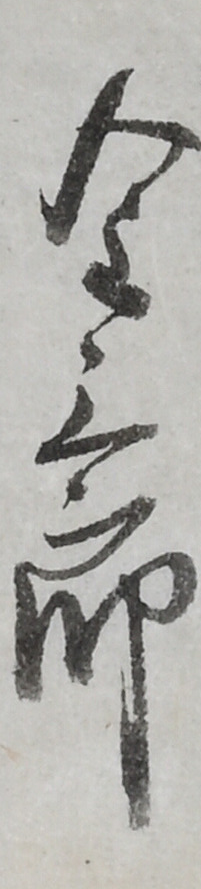金三郎

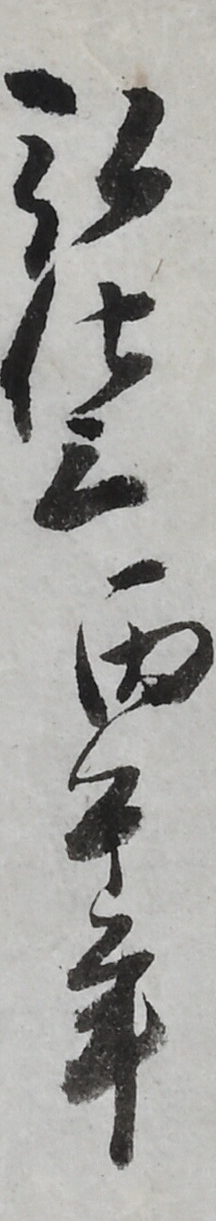弘化三丙午年
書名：年内行事帳
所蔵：伊那市立高遠町図書館・合同会社AMANE
